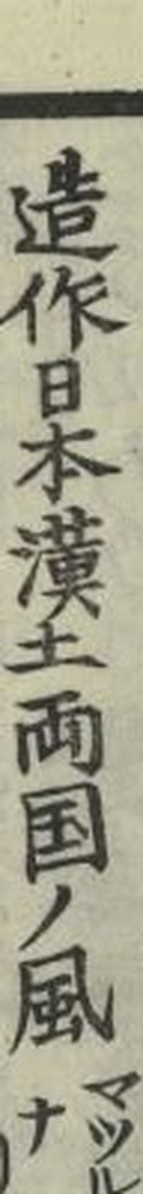造作日本漢土両国ノ風
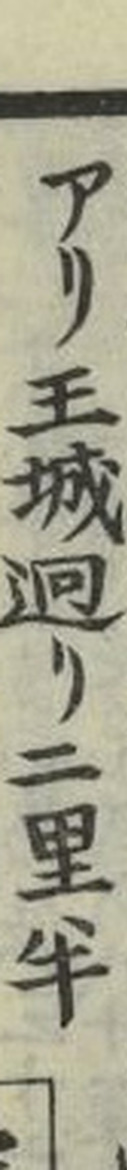アリ王城廻リ二里半
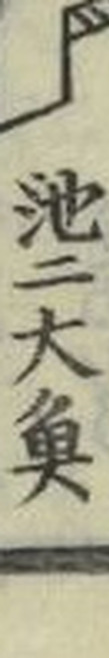池ニ大魚
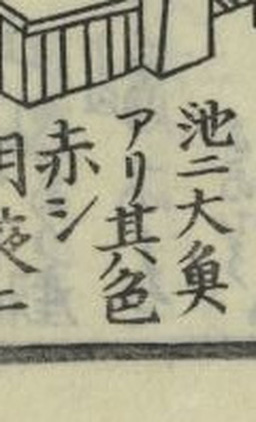アリ其色
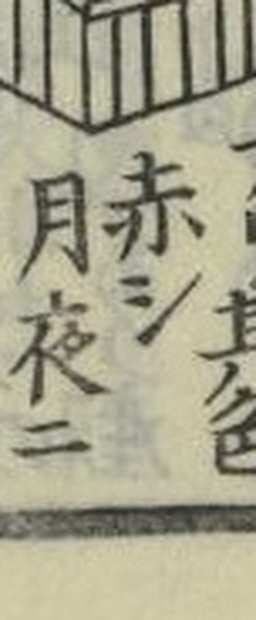月夜ニ
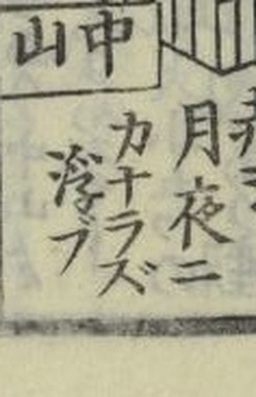カナラズ
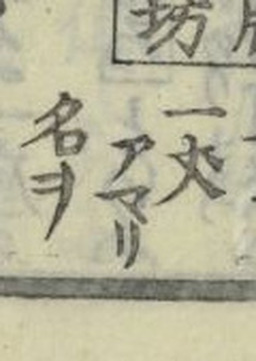アマリ
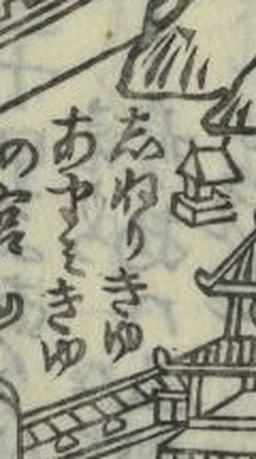しねりきゆ
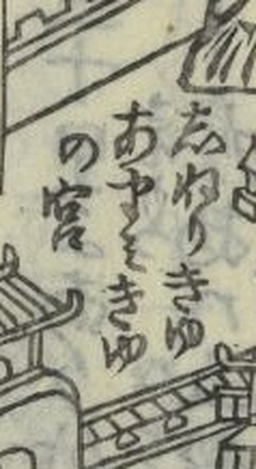あすミきゆ

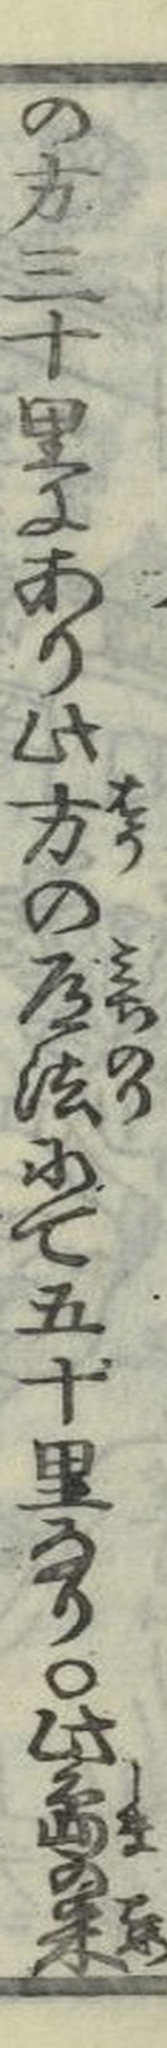の方三十里にあり此方の道法にて五十里なり〇此島の米
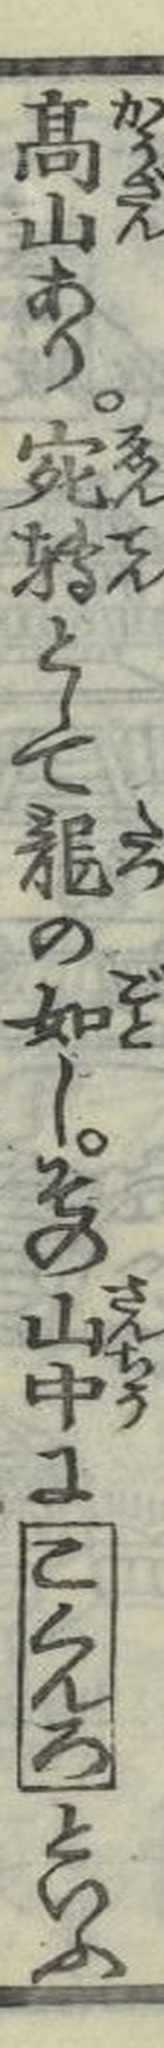高山あり。宛轉として龍の如し。その山中にこくんろといふ
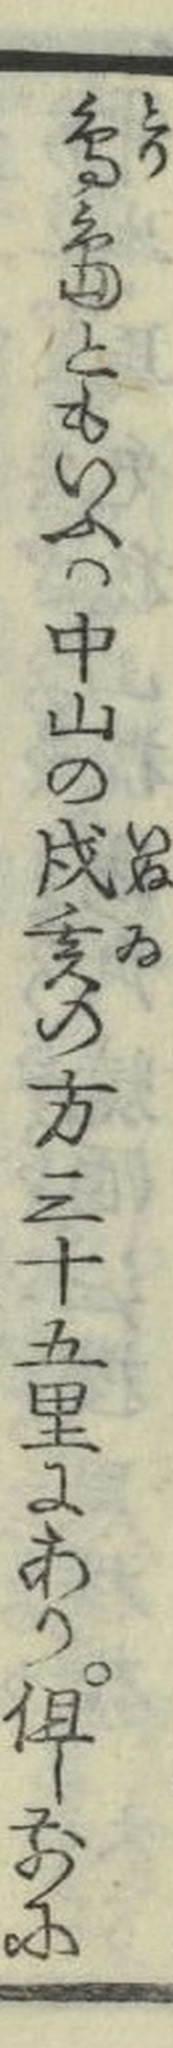鳥島ともいふ〇中山の戌亥の方三十五里にあり。但し前に
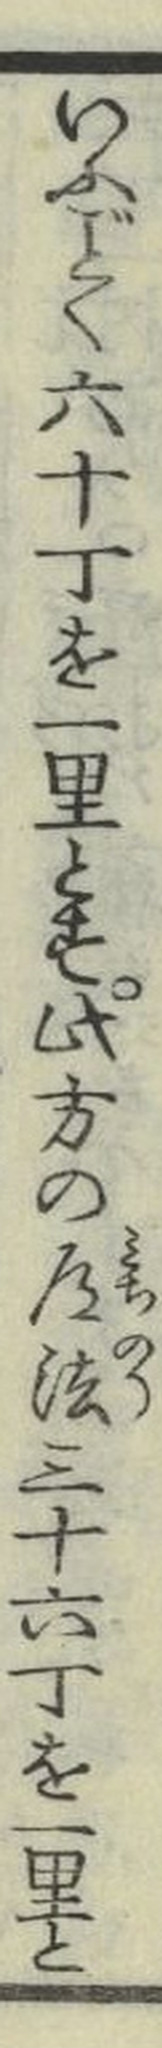いふごとく六十丁を一里とす。此方の道法三十六丁を一里と
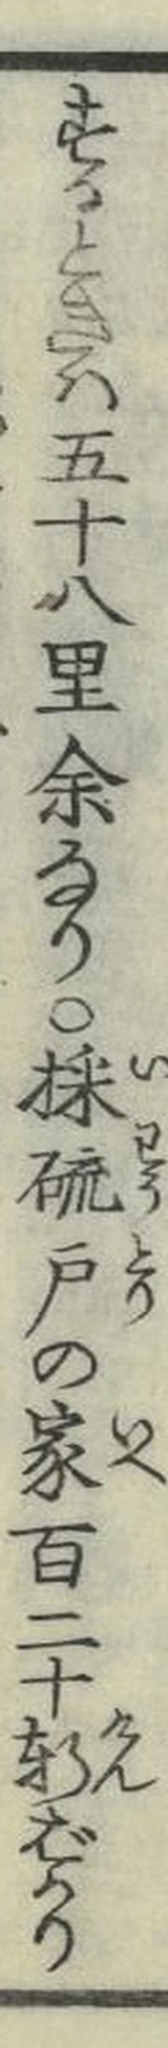するときハ五十八里余也〇採硫戸の家百二十軒ばかり
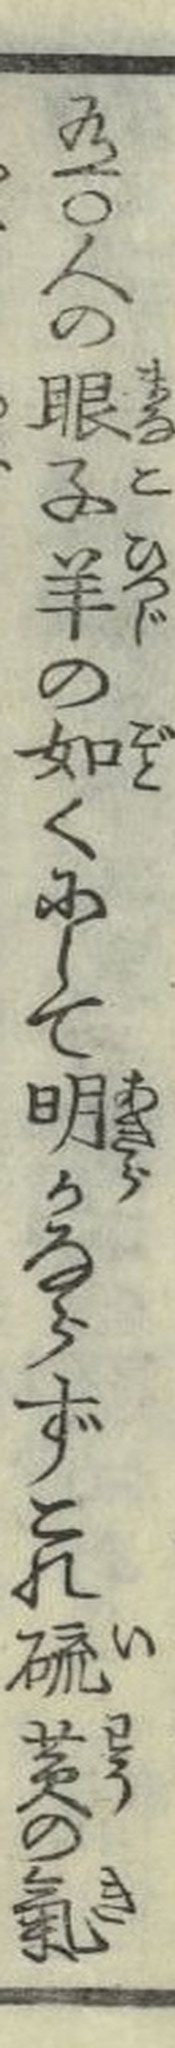有〇人の眼子羊の如くにして明かならずこれ硫黄の氣
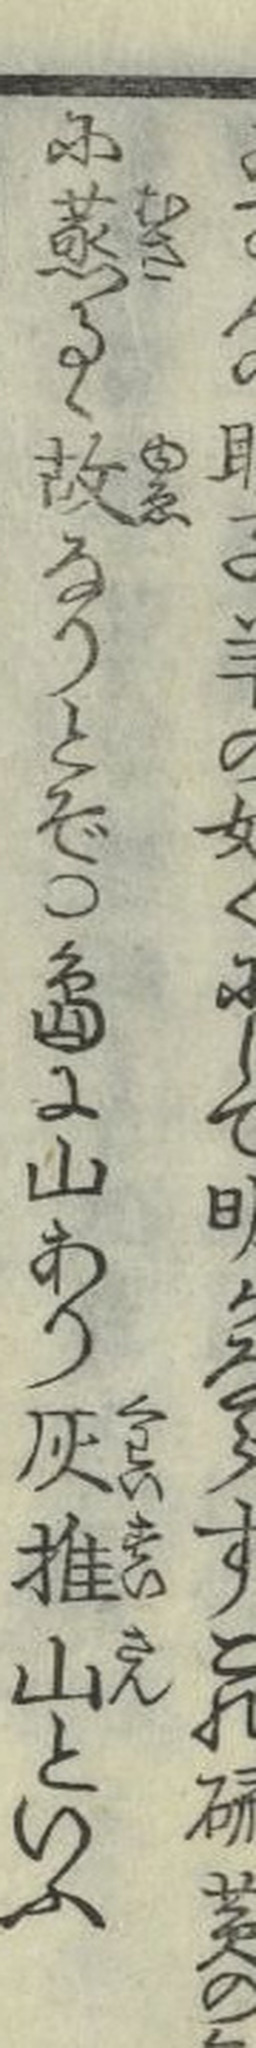に蒸るゝ故なりとぞ〇島に山あり灰推山といふ
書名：琉球奇譚
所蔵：University of the Ryukyus Library
